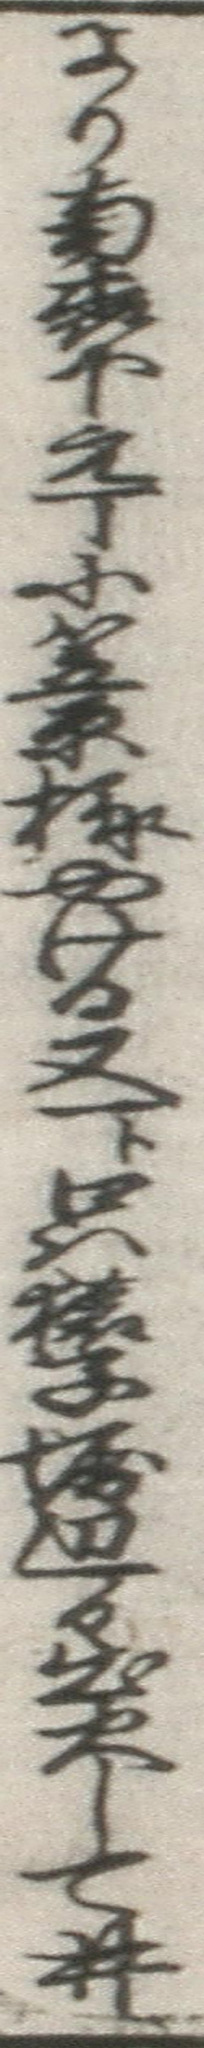より南森下元丁小笠原様やける又一ト口は猿子坂辺ゟ出火して井
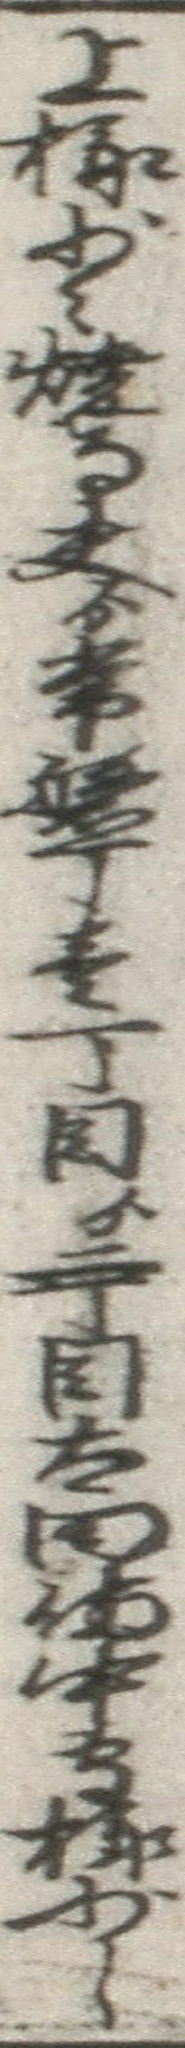上様少し焼る夫ゟ常盤丁壱丁目ゟ二丁目太田備中守様少し
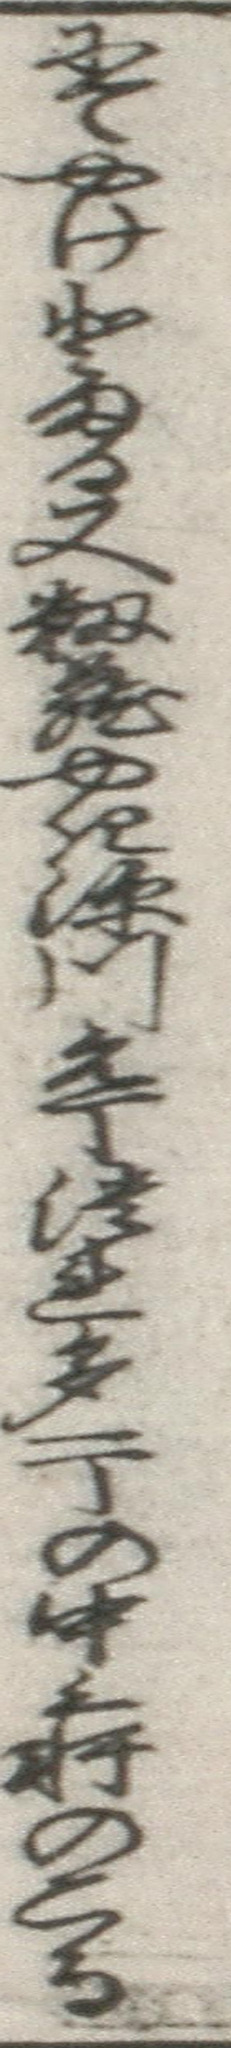にてやけとまる又籾蔵やき深川元丁潰れ多一丁の中三軒のこる
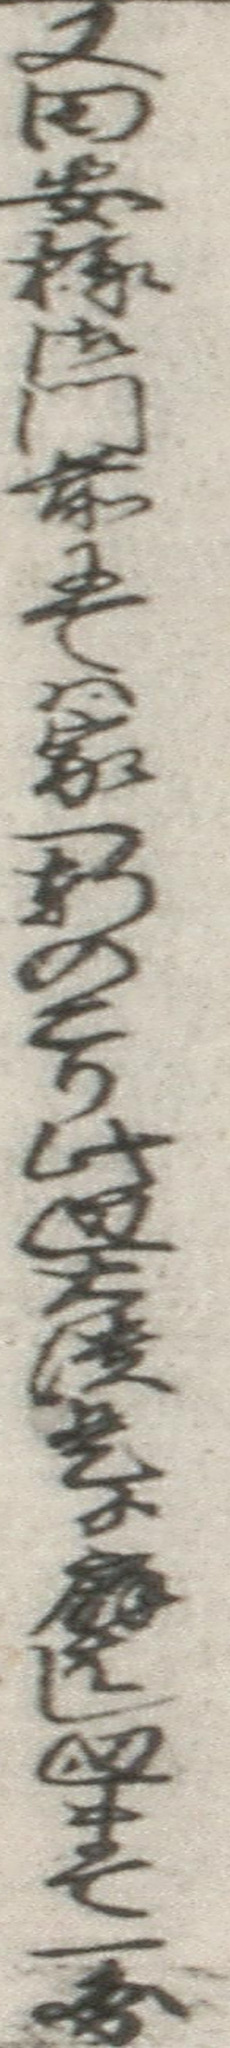又田安様御門前にては家一軒のこり此辺大潰是ゟ扇はし辺まて一円
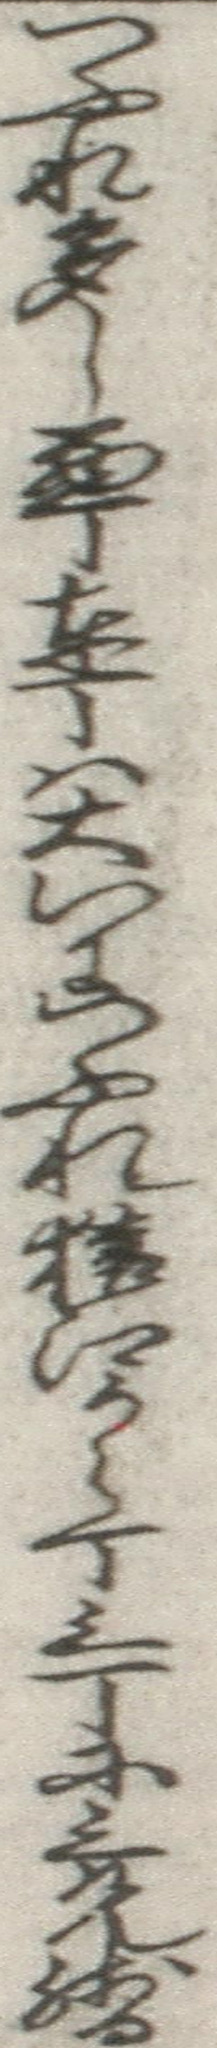つふれ多し西丁東丁は大いにつふれ猿江うら丁三丁に三けん残る
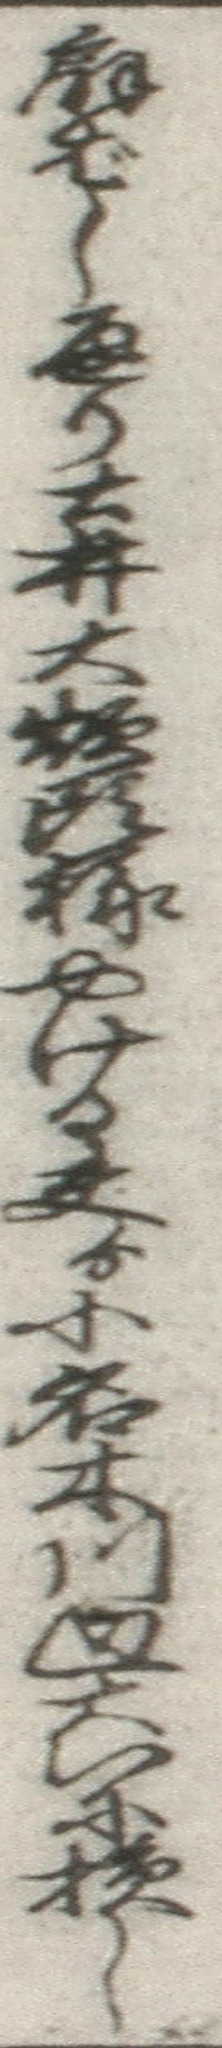扇ばし通り土井大炊頭様やける夫ゟ小名木川辺大いに損し
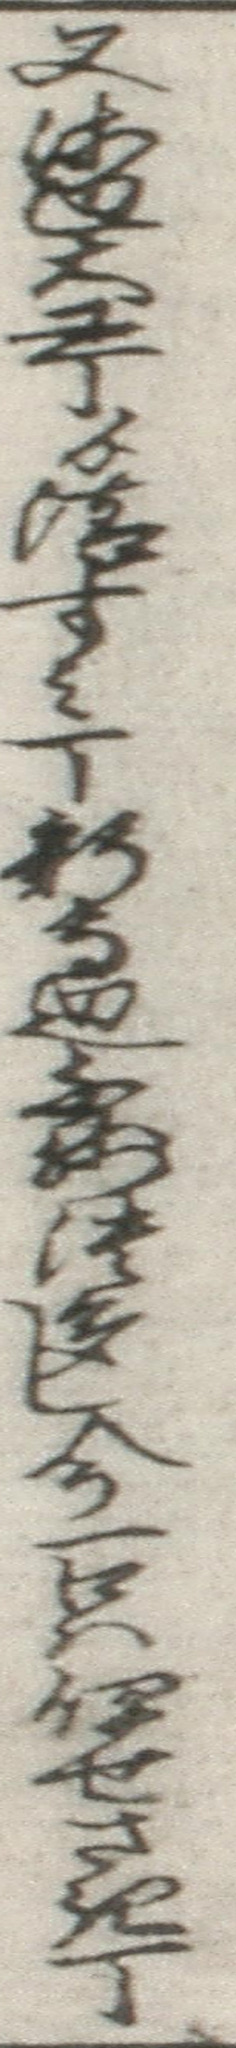又海辺大工丁ゟ清すみ丁新寺辺不残潰多し今一口は伊せさき丁
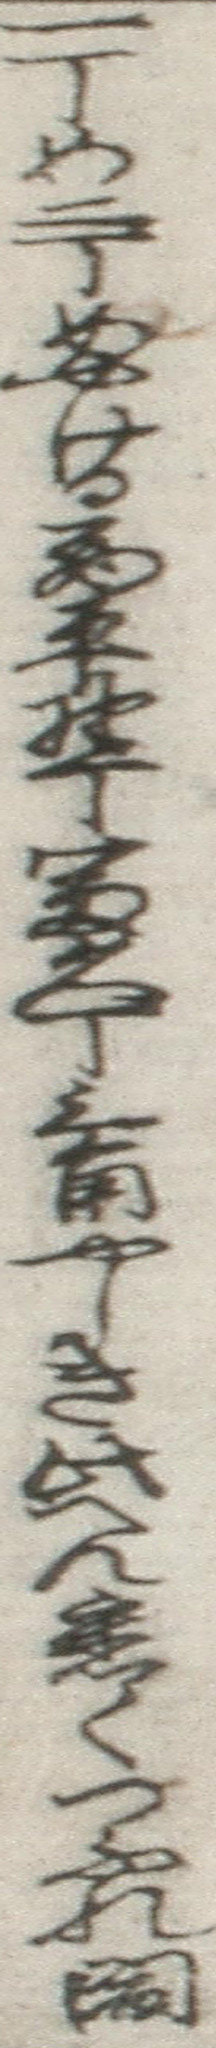一丁め二丁めやける西平野丁富久丁三角やしき此へん悉くつふれ閻
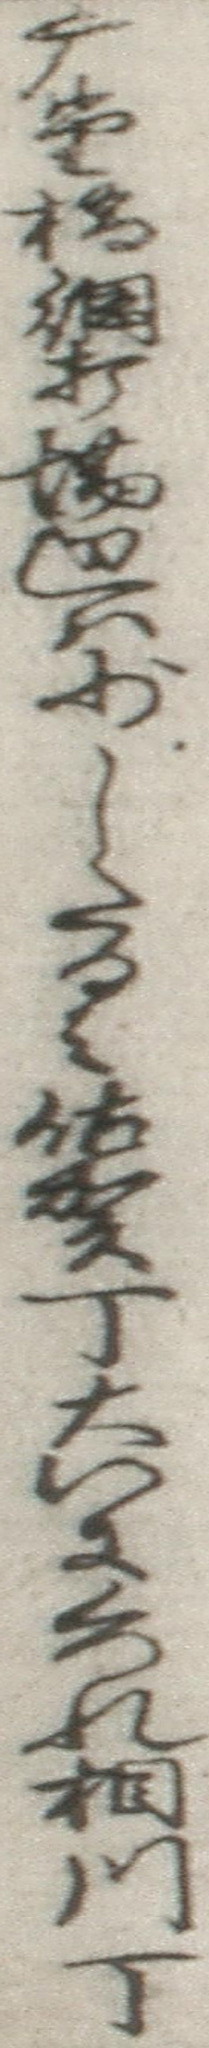魔堂橋網打場辺は少したるみ佐賀丁大いにくつれ相川丁

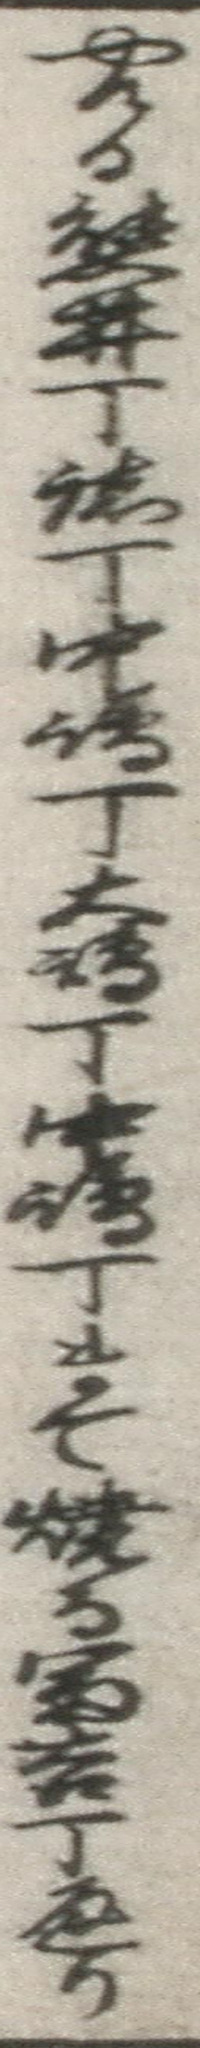やける熊井丁諸丁中嶋丁大嶋丁中嶋丁まて焼る富吉丁通り
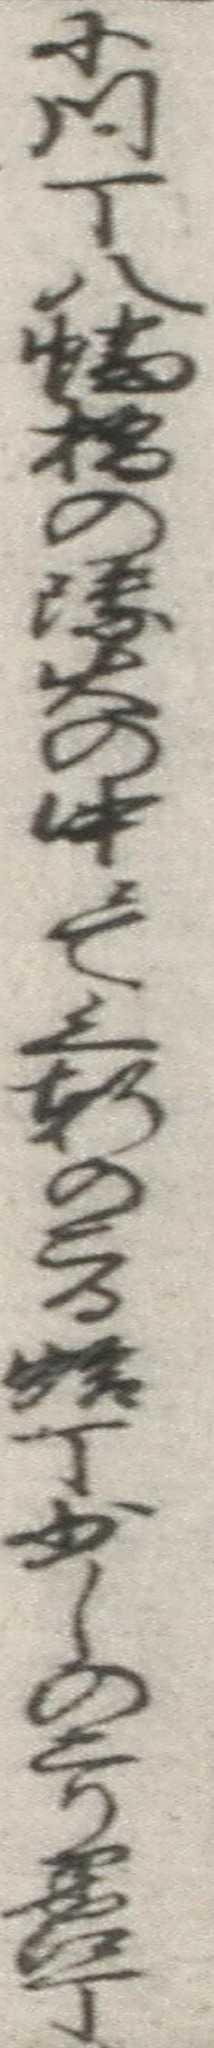小川丁八幡橋の際火の中にて三軒のこる蛤丁少しのこり黒江丁
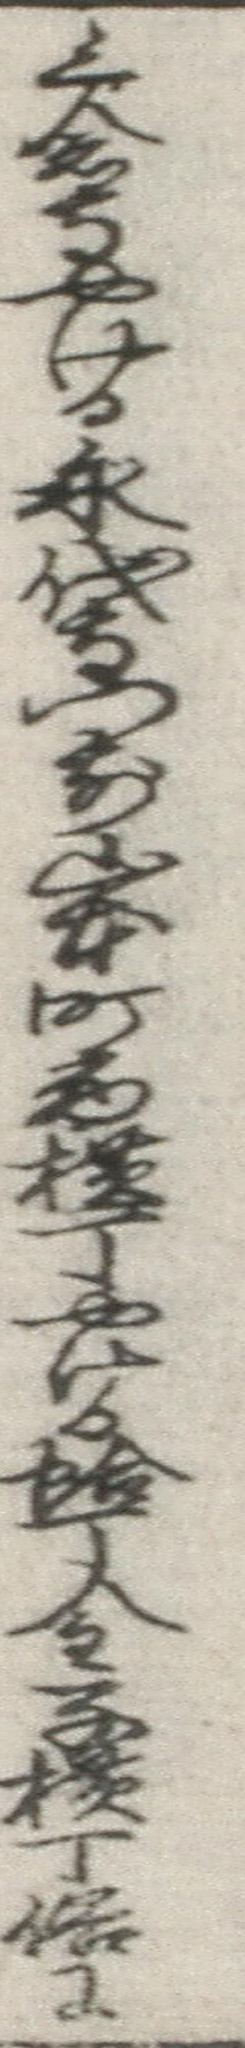三念寺やける永代寺門前山本町西横丁やける蛤丁金子横丁俗に
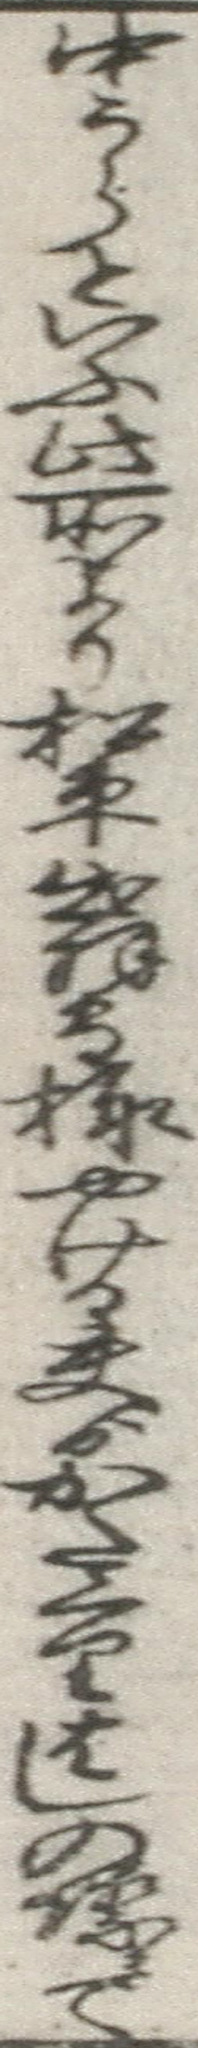中うらといふ此所より松平出羽守様やける夫ゟかたくりはしの際まて
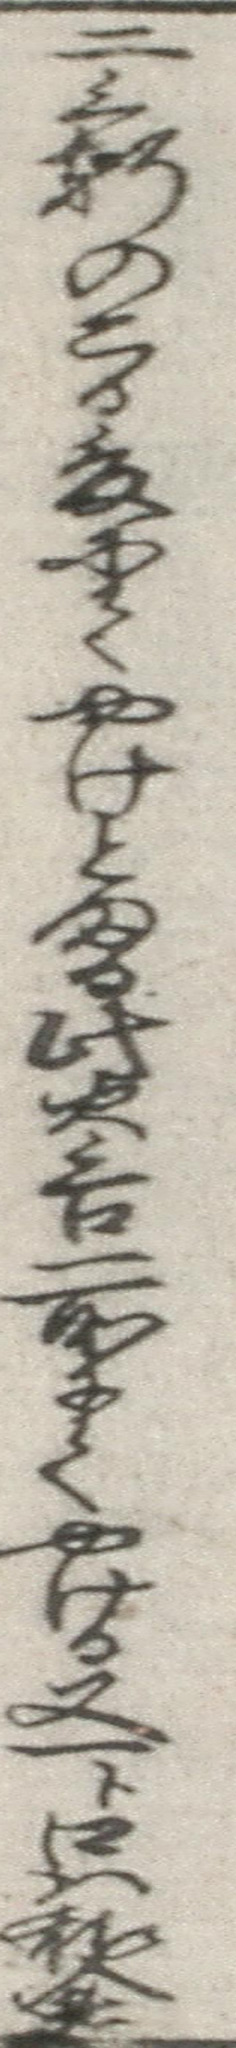二三軒のこる爰にてやけとまる此火三口一所にてやける又一ト口は和倉
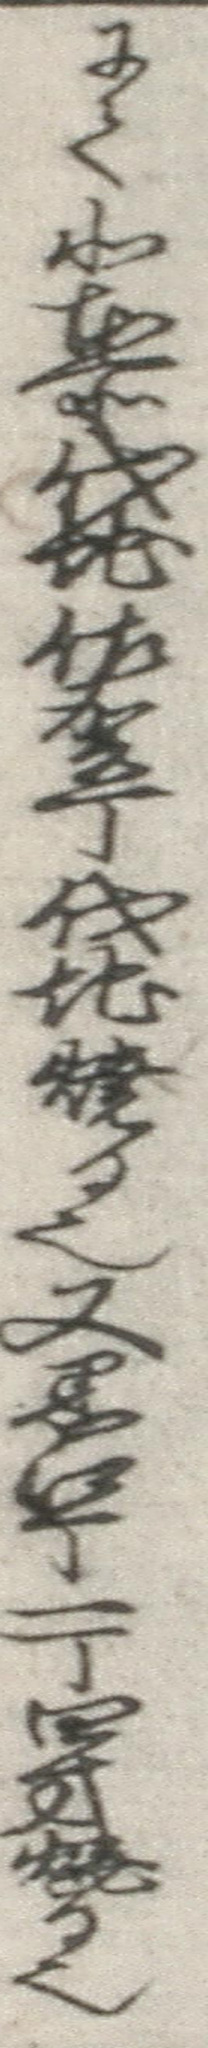にて北本所代地佐賀丁代地焼る也又黒江丁一丁四方焼る也
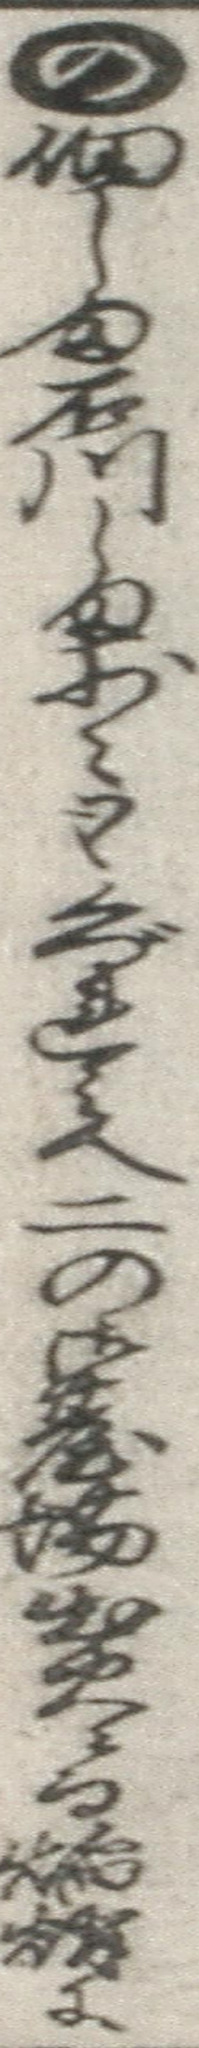の佃しま石川しま少〻ツヽくづれみへ二の御台出火にて焔硝に
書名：大地震焼場細見記
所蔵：東京大学地震研究所図書室 Earthquake Research Institute Library, The University of Tokyo, JAPAN
